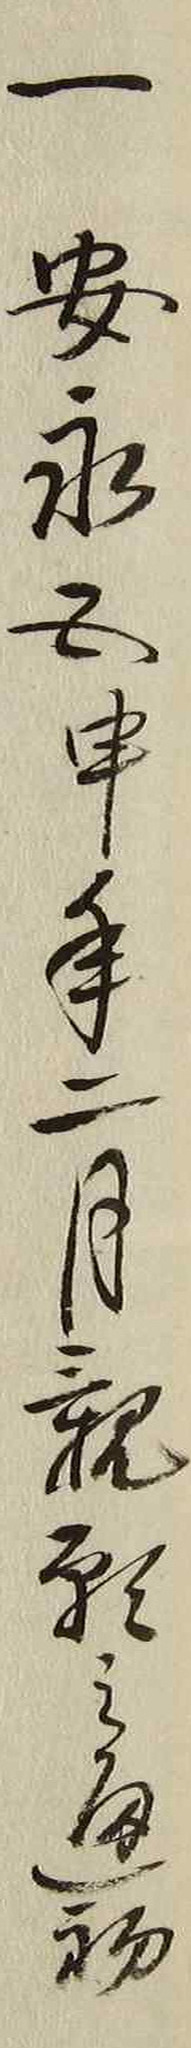一安永五申年二月親願之通初
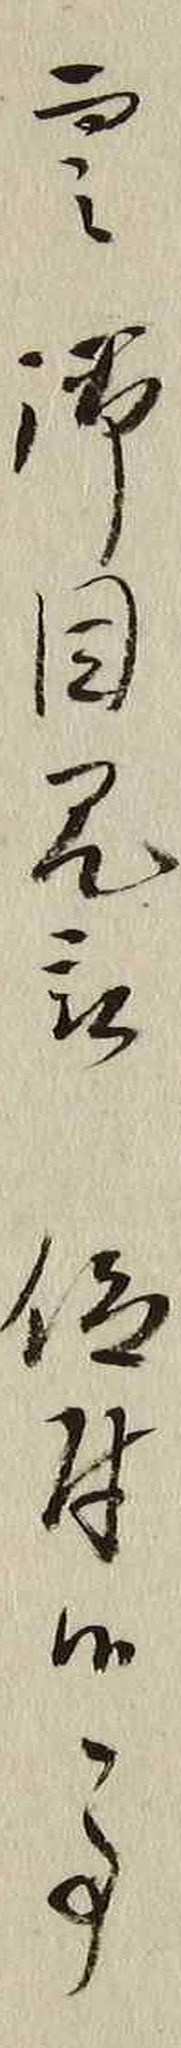而之御目見被仰付候事
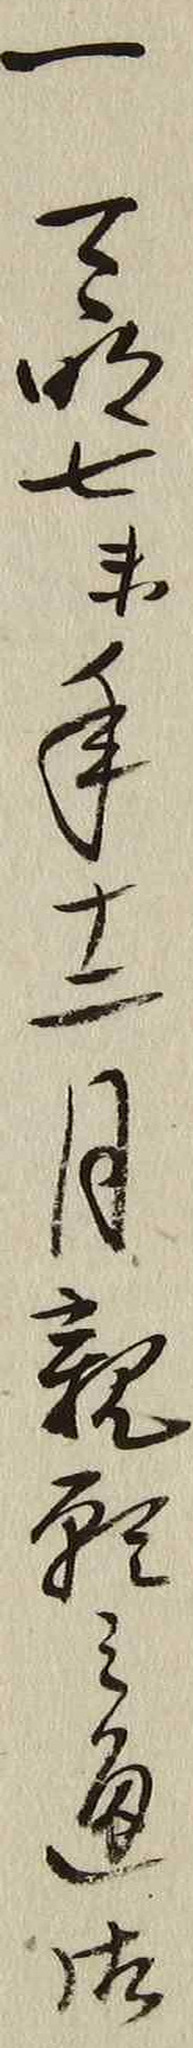一天明七未年十二月親願之通御
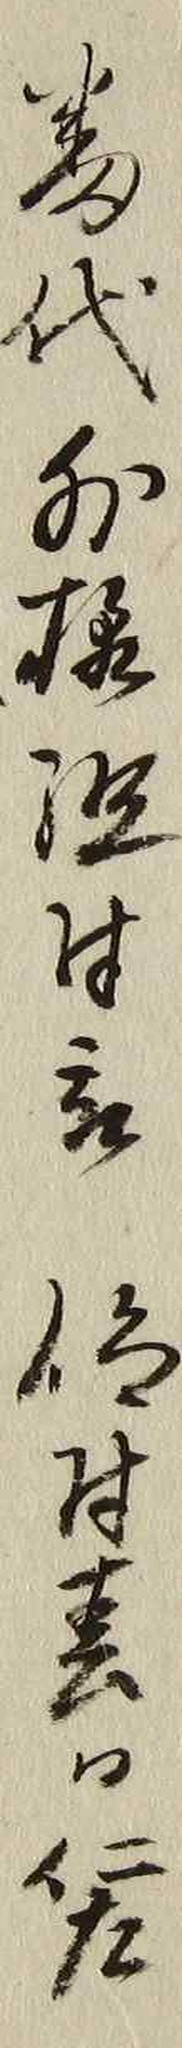番代外様組付被仰付春日仁左
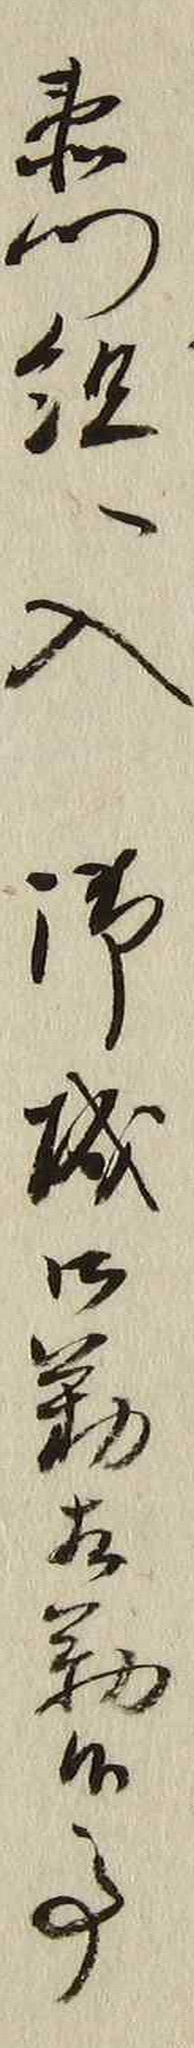衛門組へ入御城御勤相勤候事
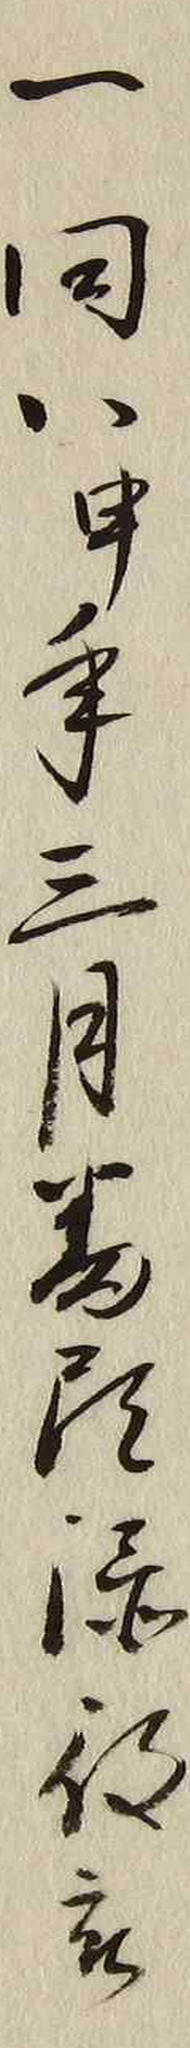一同八申年三月番頭添役被
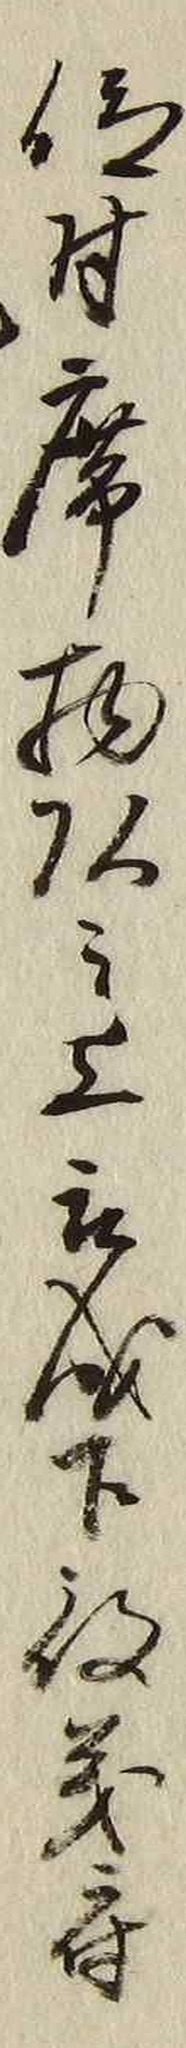仰付席物頭之上被成下役義ニ付
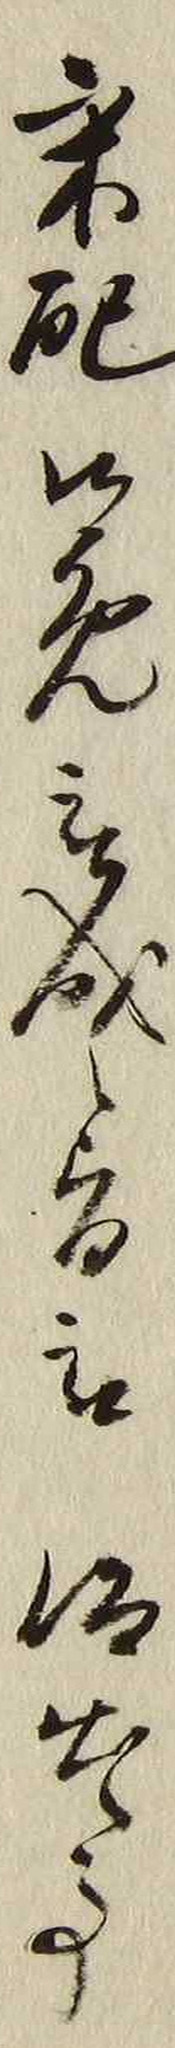采配御免被成之旨被仰出候事
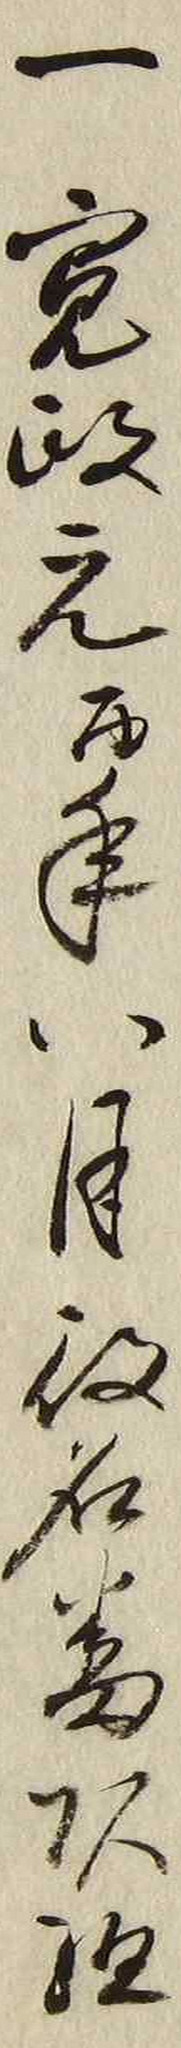一寛政元酉年八月役名番頭組
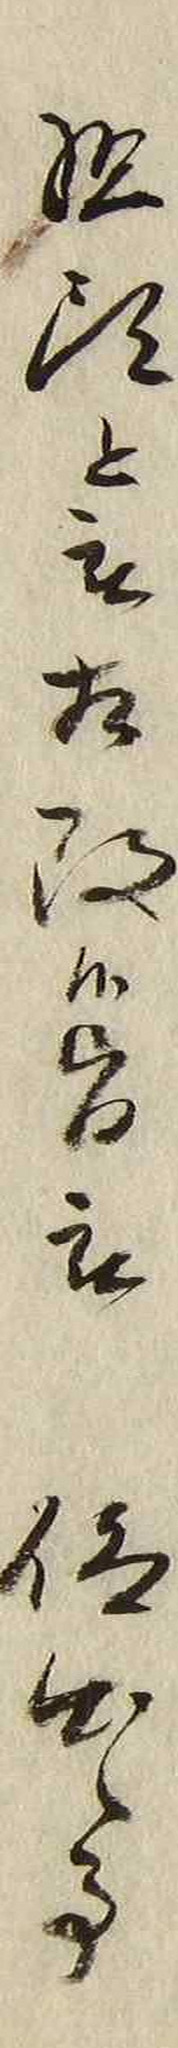組頭と被相改候旨被仰出候事

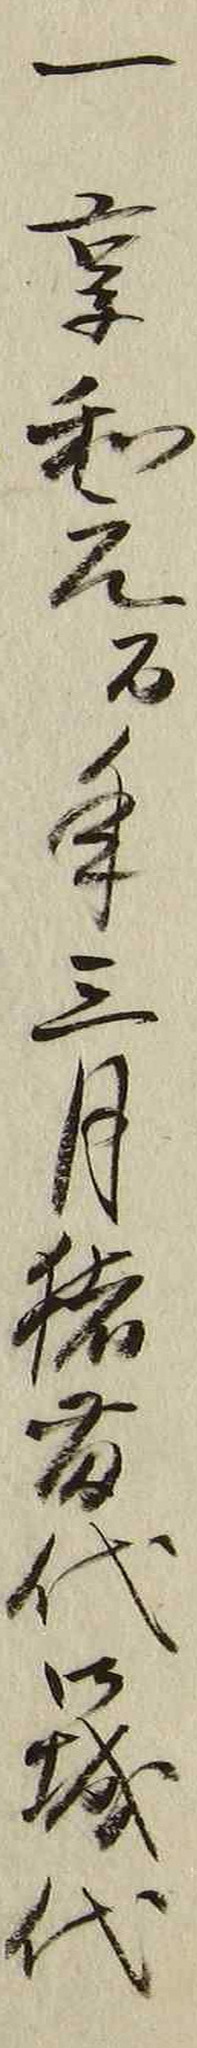一享和元酉年三月猪苗代御城代
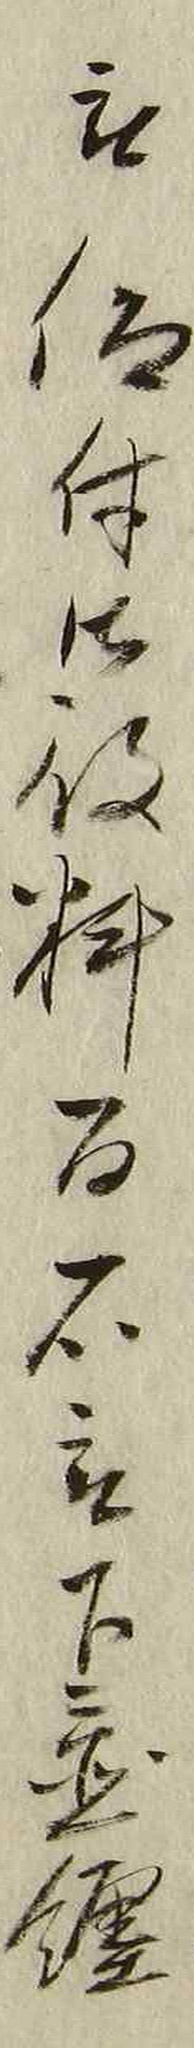被仰付御役料百石被下置纏
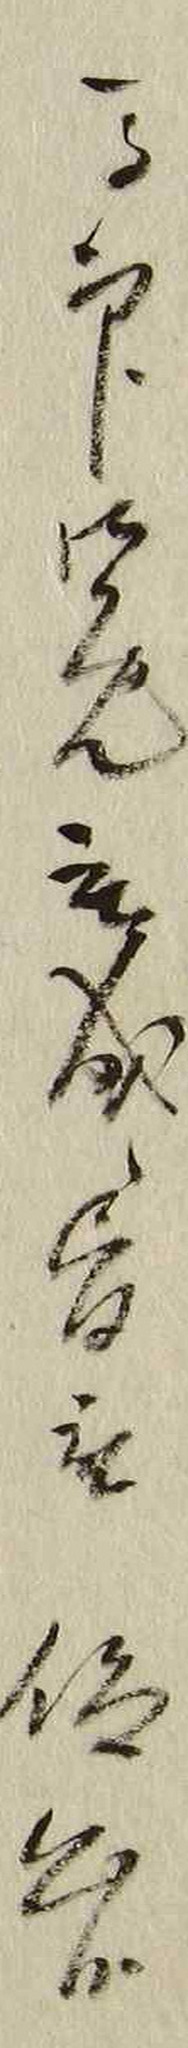馬印御免被成候旨被仰出候
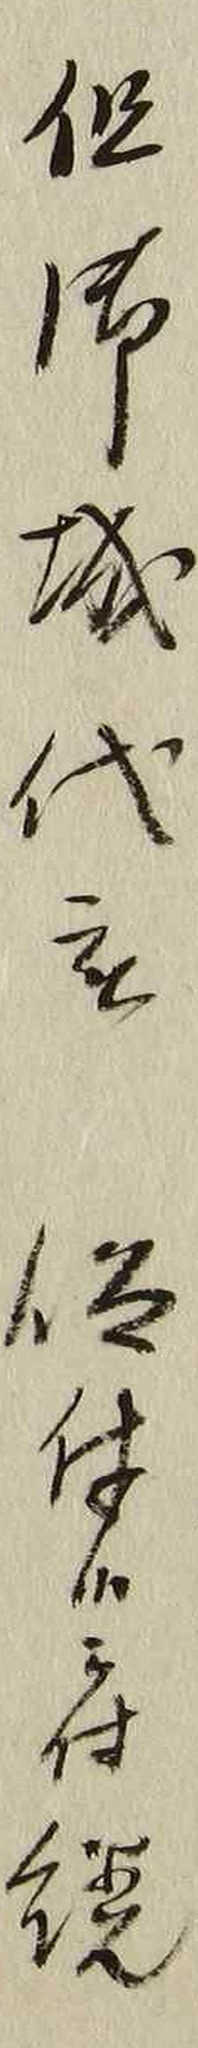但御城代被仰付候ニ付纜
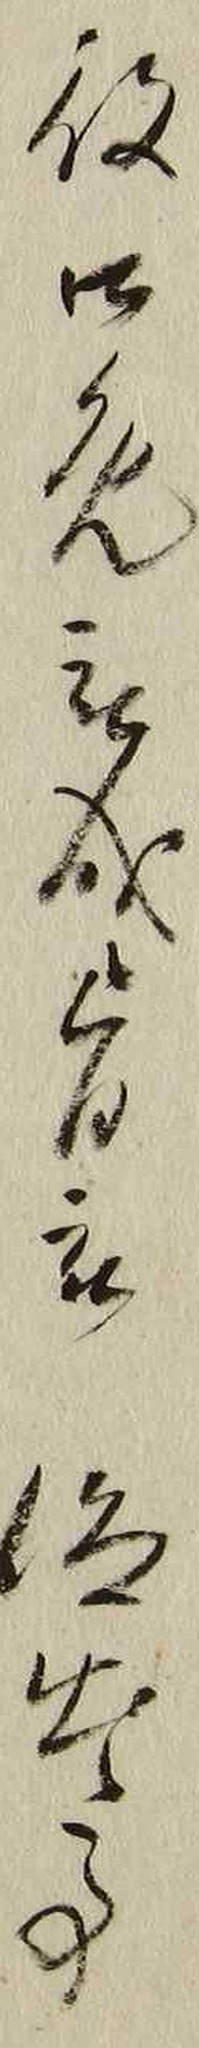役御免被成候旨仰出候事
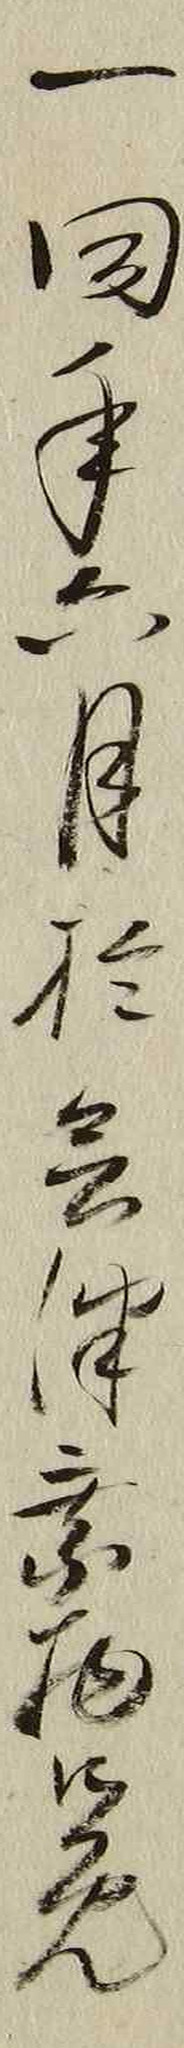一同年六月於会津乗物御免
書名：諸士系譜　巻之351　す之部1
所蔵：会津若松市立会津図書館
